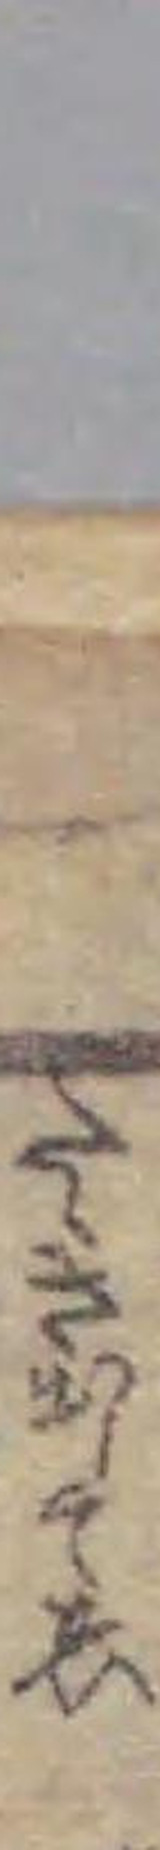叩き出してし
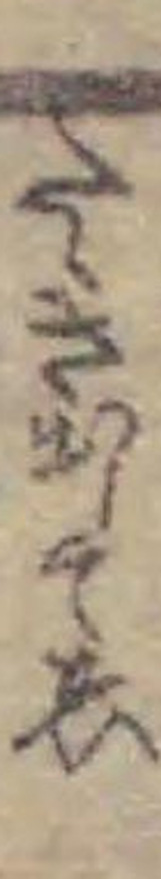叩き出してし
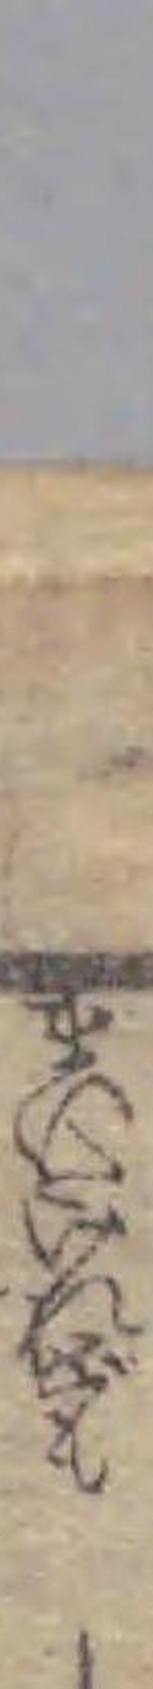まいたけれども
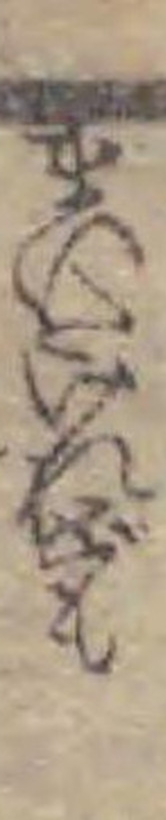まいたけれども
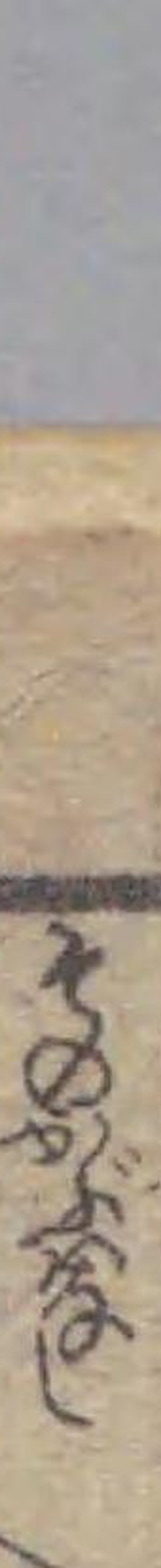そのかぶはなし
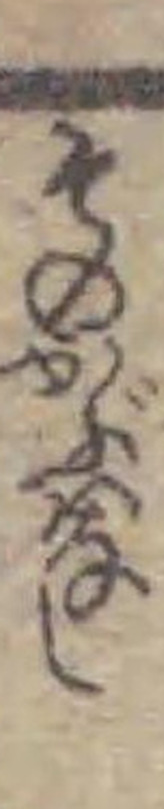そのかぶはなし
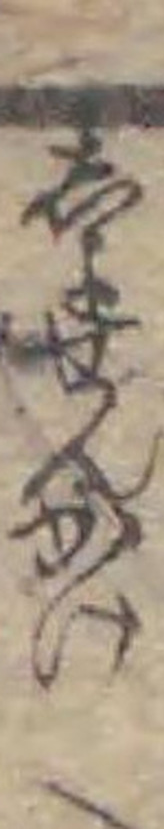しょせんかけ
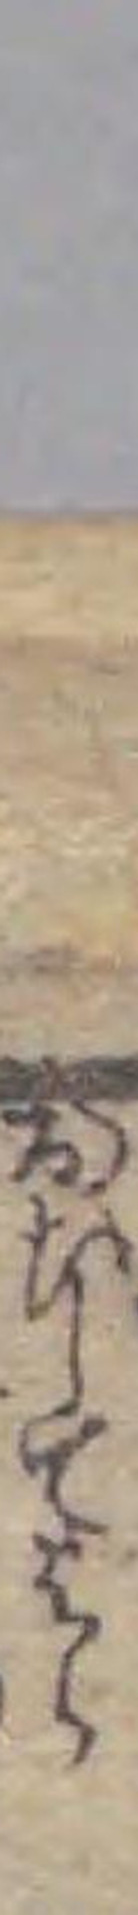おちしてはら
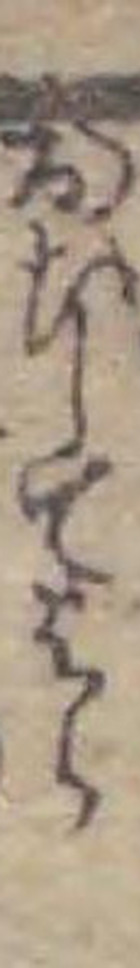おちしてはら
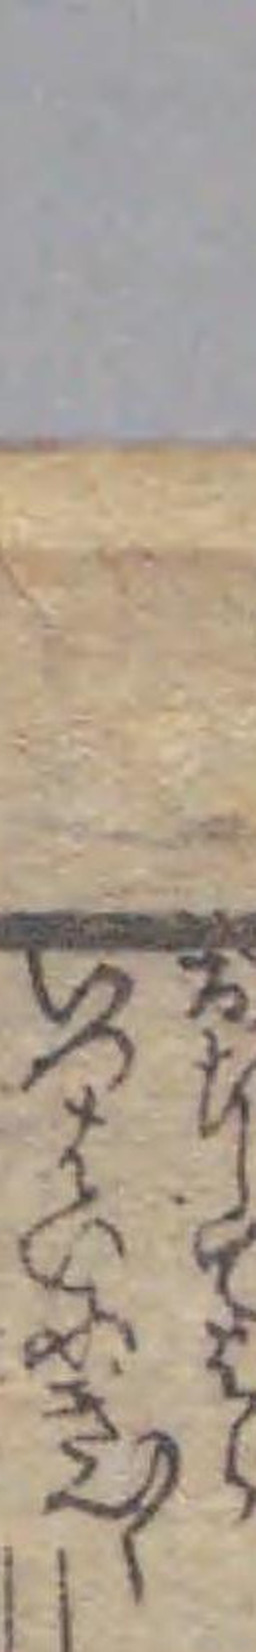いっぱいにきん〳〵
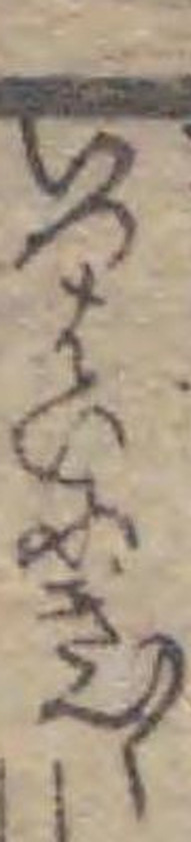いっぱいにきん〳〵
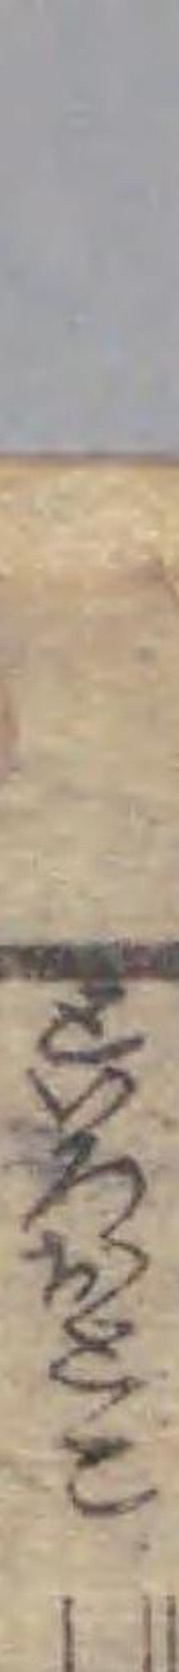といろおとこ
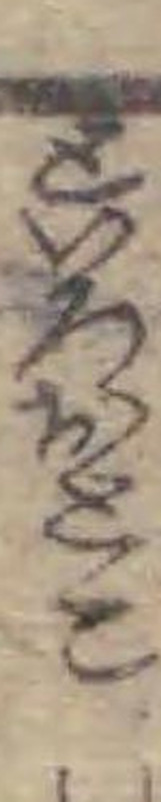といろおとこ
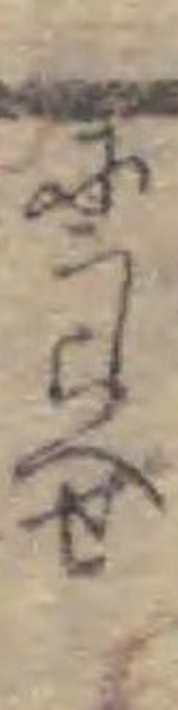にこしらへせ
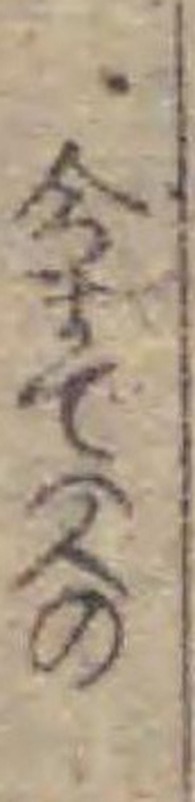今までは人の
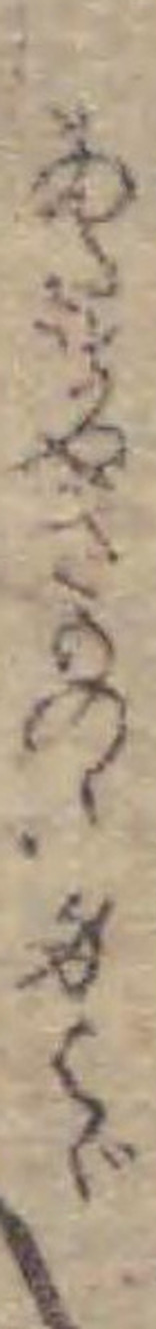あたまやきものの身はば
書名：通風伊勢物語 : 3巻
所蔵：国立国会図書館 National Diet Library, JAPAN
